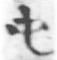屯
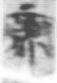彔（綠）
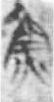魚
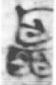聶（攝）
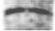一
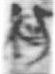紫
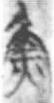魚
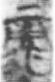彔（綠）
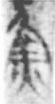魚
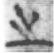之
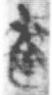○（箙）
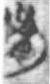○（絶）
